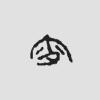宵
